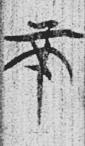不
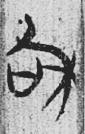和
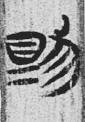則
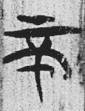不
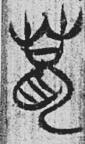{艸咠}（輯）
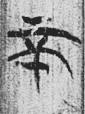不
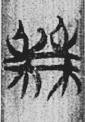兼（謙）
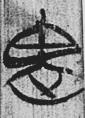畏
